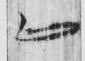㠯（以）
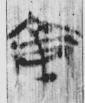○（就）
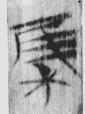集
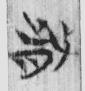歲（歲）
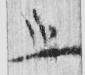之
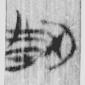○（荆）
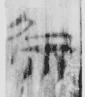𫵖
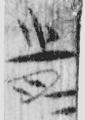之月
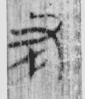○（盡）
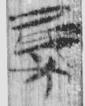集
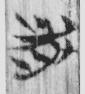歲（歲）
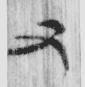又
